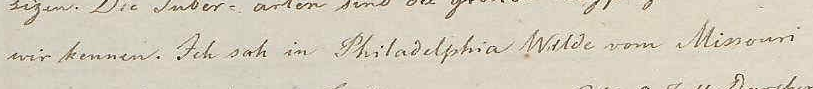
wir kennen. Ich sah in Philadelphia Wilde vom Missouri
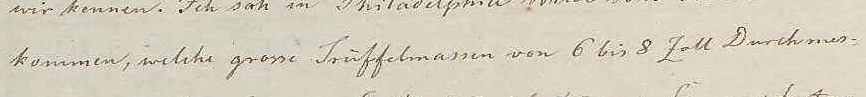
kommen, welche grosse Trüffelmassen von 6 bis 8 Zoll Durchmes-
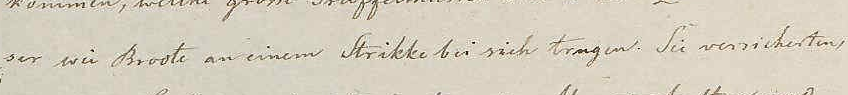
ser wie Brodte an einem Strikke bei sich trugen. Sie versicherten,
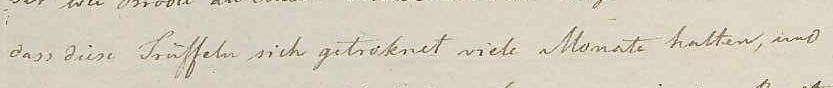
dass diese Trüffeln sich getroknet viele Monate halten, und
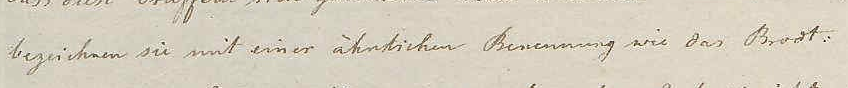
bezeichnen sie mit einer ähnlichen Benennung wie das Brodt:
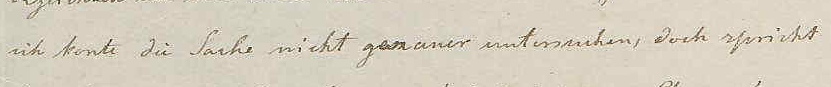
ich konte die Sache nicht genauer untersuchen, doch spricht
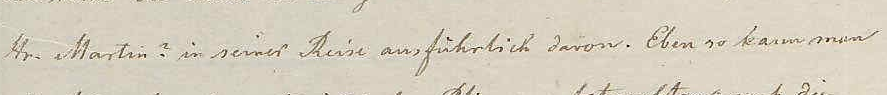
Hr. Martin ? in seiner Reise ausführlich davon. Eben so kann man
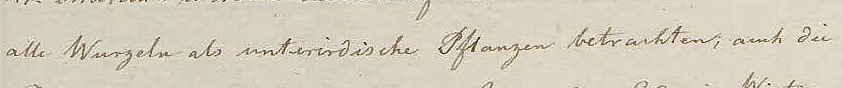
alle Wurzeln als unterirdische Pflanzen betrachten, auch die
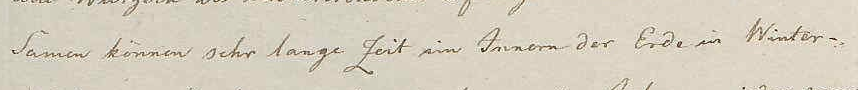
Samen können sehr lange Zeit im Innern der Erde im Winter-
